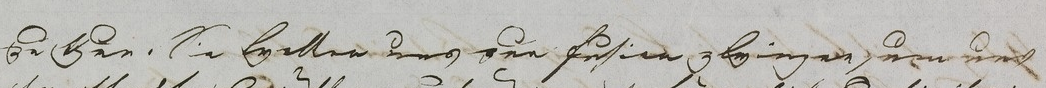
zu thun. Sie wollen uns zur Fusion zwingen, um uns
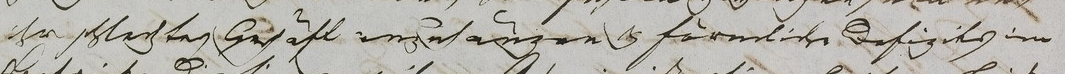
ihr schlechtes Geschäft anzuhängen & förmliche Defizits im
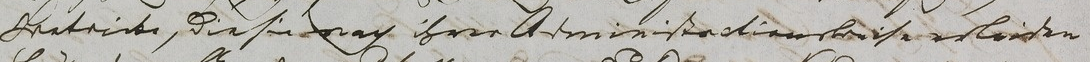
Betriebe, die sie nach ihrer Administrationsweise erleiden
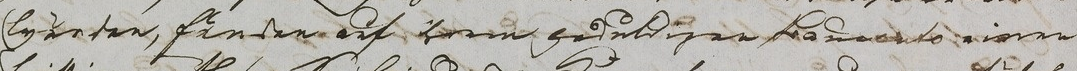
würden, fänden auf ihrem geduldigen Bauconto einen
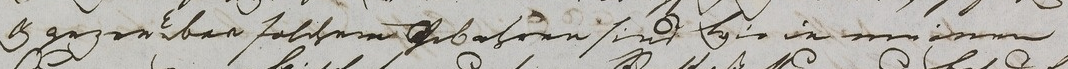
& gegenüber solchem Gebahren sind wir in meinen
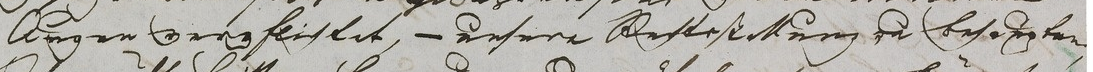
Augen verpflichtet, – unsere Rechtsstellung zu behaupten.
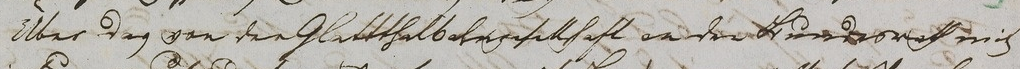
Über das von der Glattthalbahngesellschaft an den Bundesrath mit
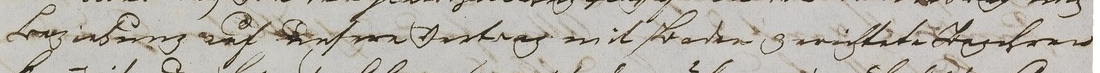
Beziehung auf unsern Vertrag mit Baden gerichtete Begehren
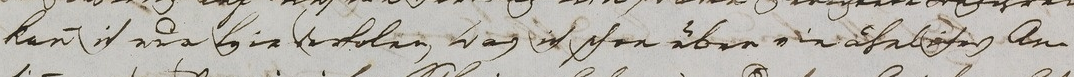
kann ich nur wiederholen, was ich schon über ein ähnliches An-
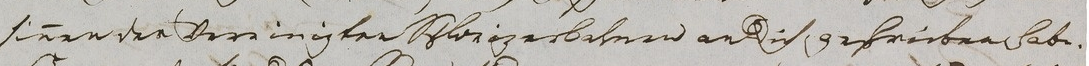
sinnen der Vereinigten Schweizerbahnen an Dich geschrieben habe.
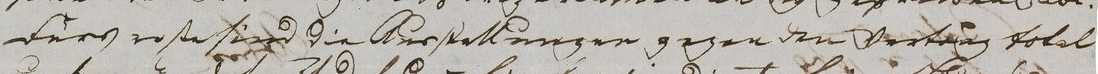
Fürs erste sind die Ausstellungen gegen den Vertrag total
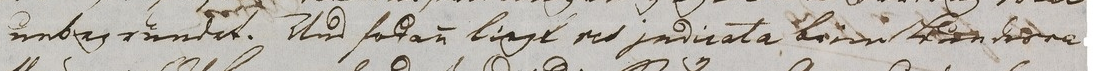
unbegründet. Und sodann liegt res judicata beim Bundesra-
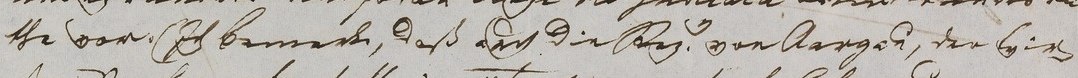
the vor. (Ich bemerke, daß auch die Regg von Aargau, der wir
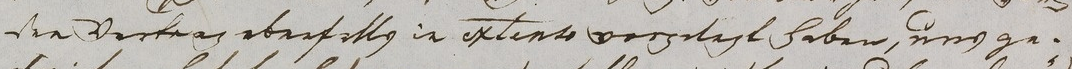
den Vertrag ebenfalls in extenso vorgelegt haben, uns ge-
